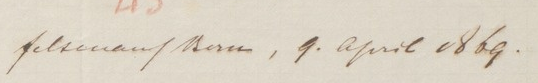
Felsenau / Bern, 9. April 1869.
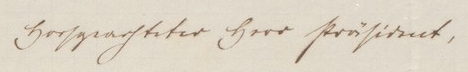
Hochgeachteter Herr Präsident,
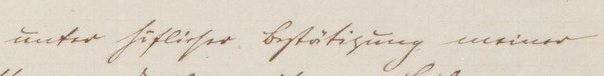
unter höflicher Bestätigung meiner
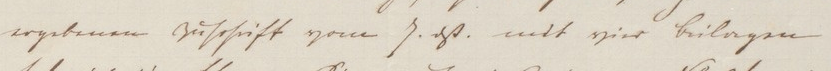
ergebenen Zuschrift vom 7. dß. mit vier Beilagen
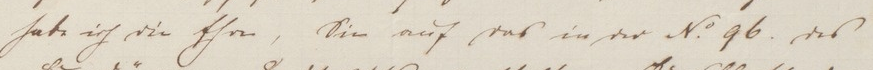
habe ich die Ehre, Sie auf das in der No 96. des
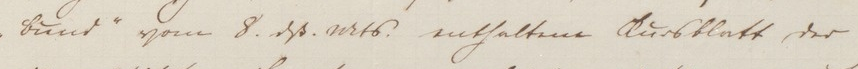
«Bund» vom 8. dß. Mts. enthaltene Kursblatt der
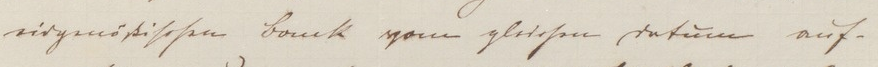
eidgenößischen Bank vom gleichen Datum auf-
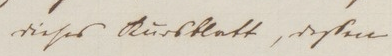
Dieses Kursblatt, dessen
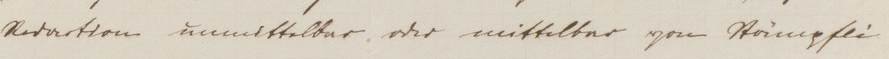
Redaction unmittelbar oder mittelbar von Stämpfli
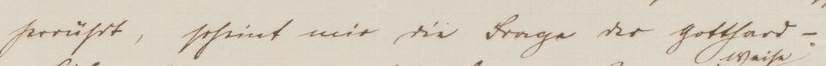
herrührt, scheint mir die Frage der Gotthard-
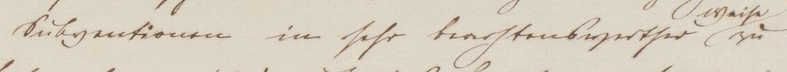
Subventionen in sehr beachtenswerter Weise zu
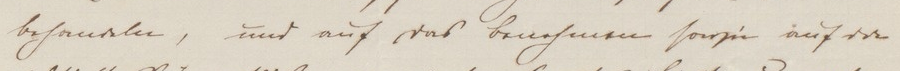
behandeln, und auf das Benehmen sowie auf die
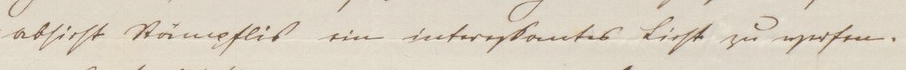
Absicht Stämpflis ein interessantes Licht zu werfen.
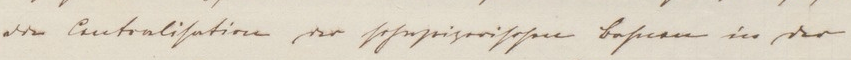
Die Centralisation der schweizerischen Bahnen in der
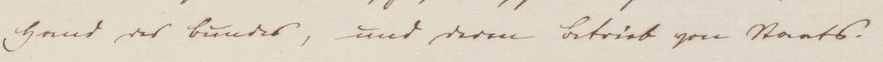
Hand des Bundes, und deren Betrieb von Staats-
